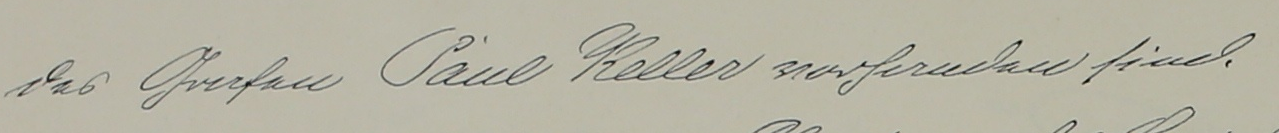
des Grafen Paul Keller vorhanden sind.
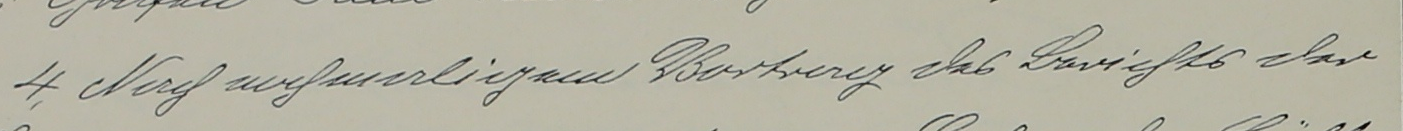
4. Nach nochmaligem Vortrag des Berichts der
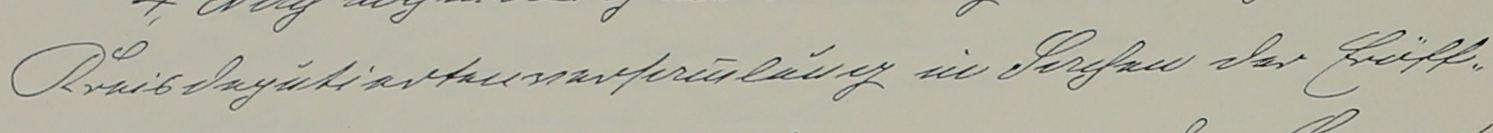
Kreisdeputiertenversammlung in Sachen der Eröff-
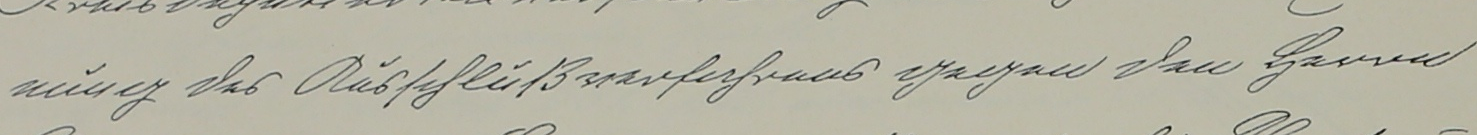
nung des Ausschlußverfahrens gegen den Herrn
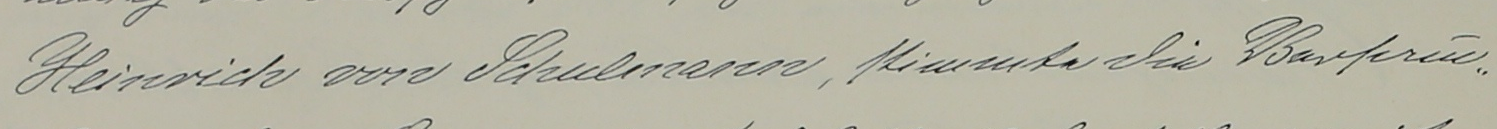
Heinrich von Schulmann, stimmte die Versamm-
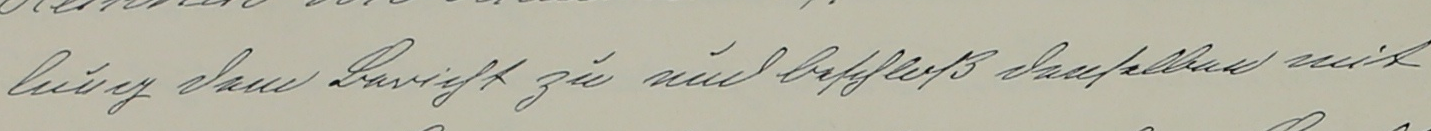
lung dem Bericht zu und beschloß denselben mit
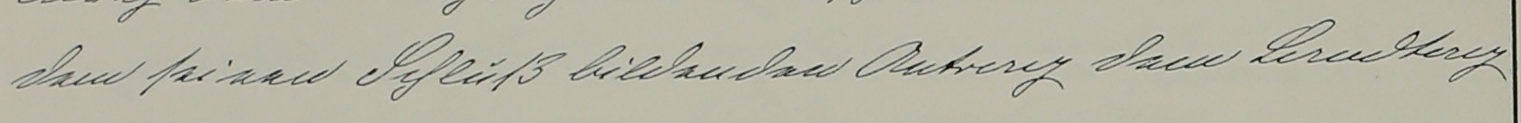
dem seinen Schluß bildenden Antrag dem Landtag
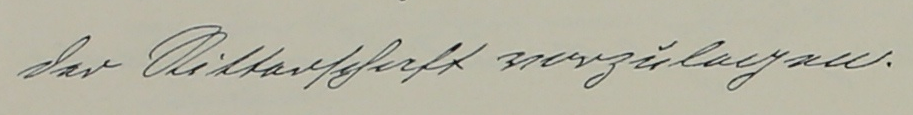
der Ritterschaft vorzulegen.
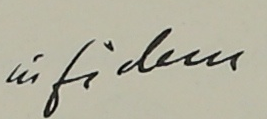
in fidem
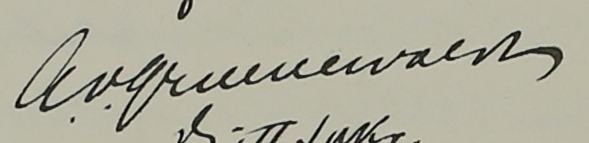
A.v.Gruenewaldt
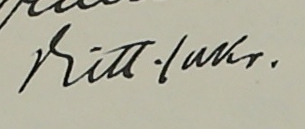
Ritt.sekr.
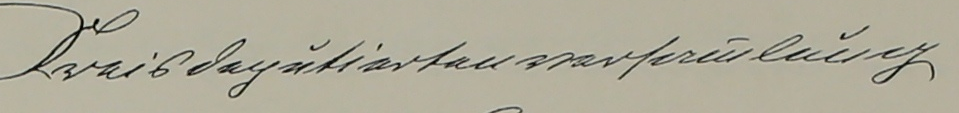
Kreisdeputiertenversammlung
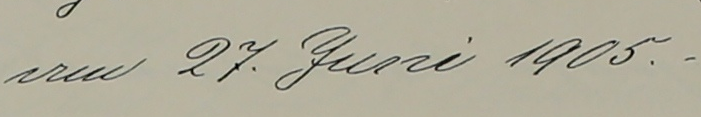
am 27. Juni 1905.
